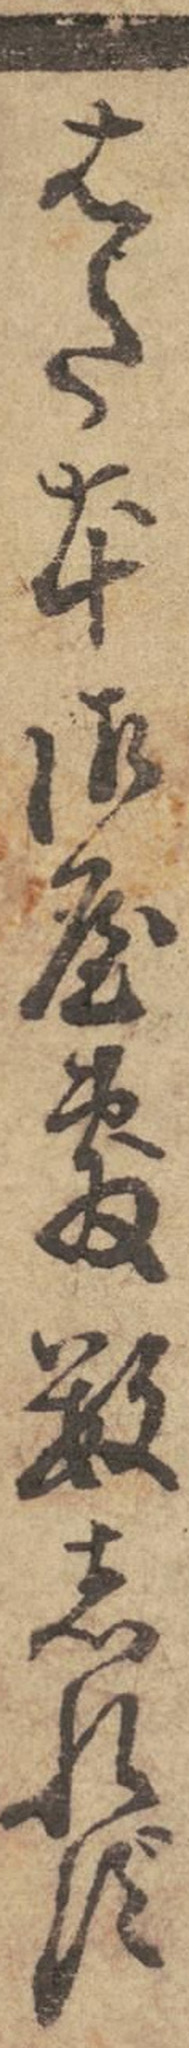はた本御家敷数しれず
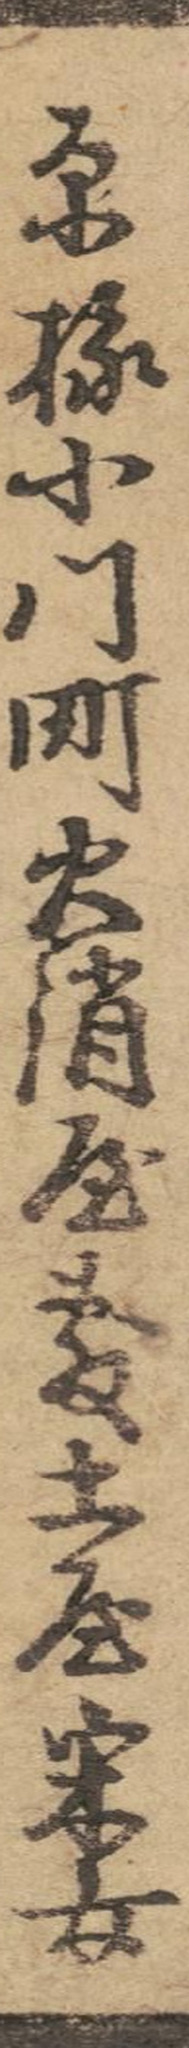原様小川町火消屋敷土屋采女
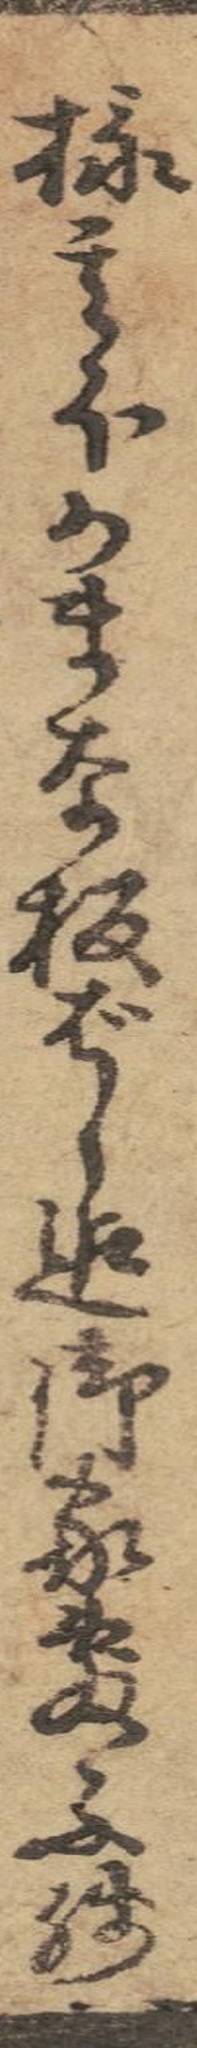様其ほかまないたばし迄御家敷不残
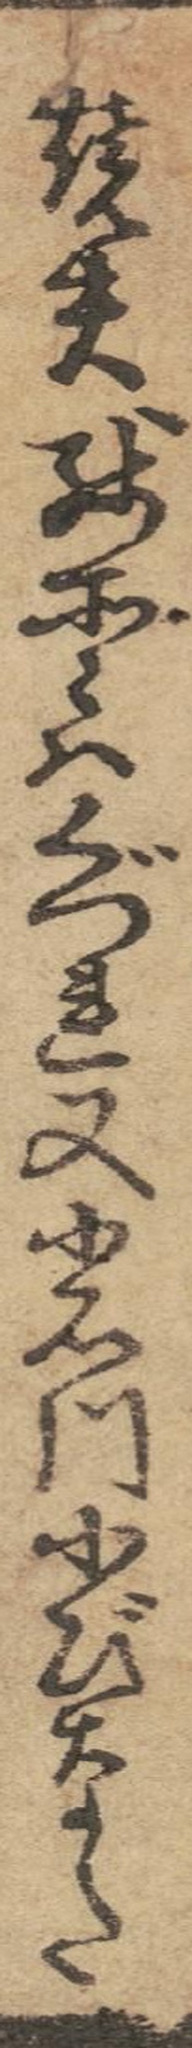焼失残所々ハくづれ又小石川小びなた
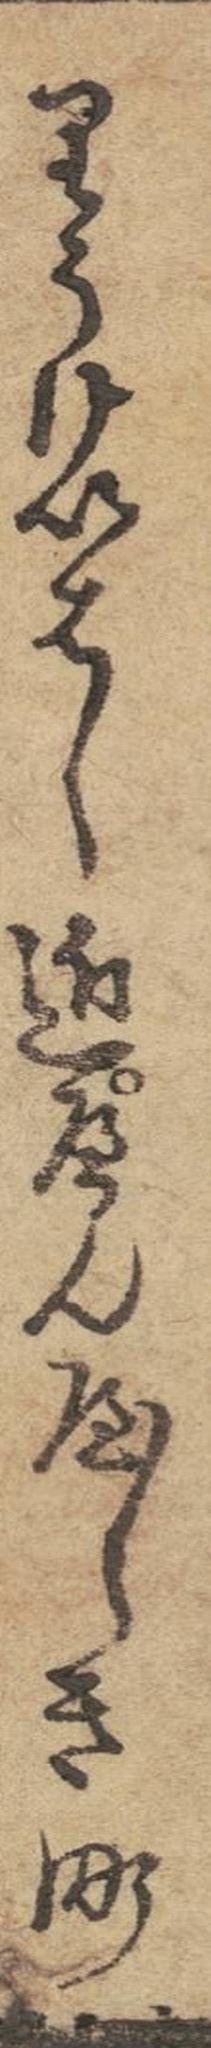りうけいはし近ぺんやしき町
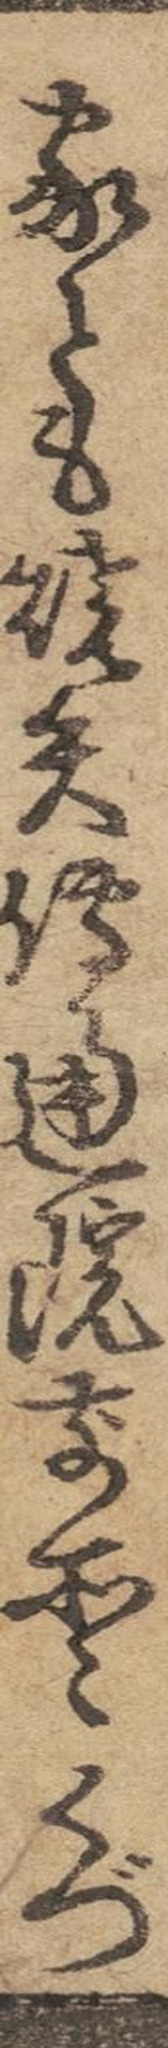家とも焼失伝通院前所々くづ
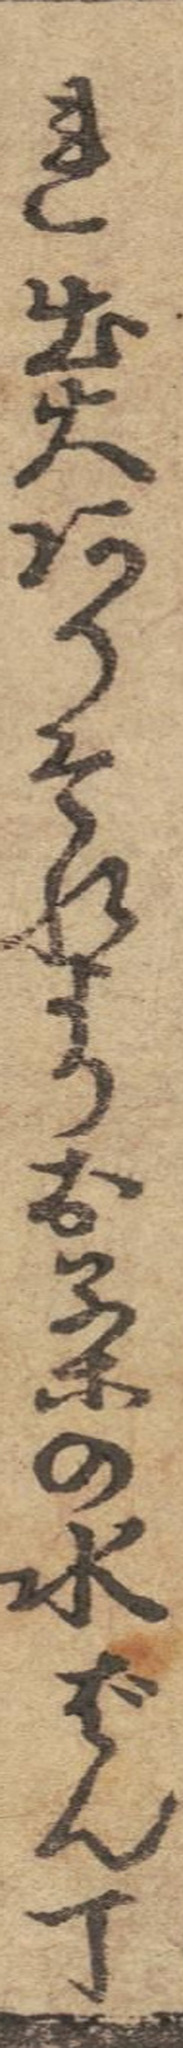れ出火ありそれよりお茶の水ばん丁
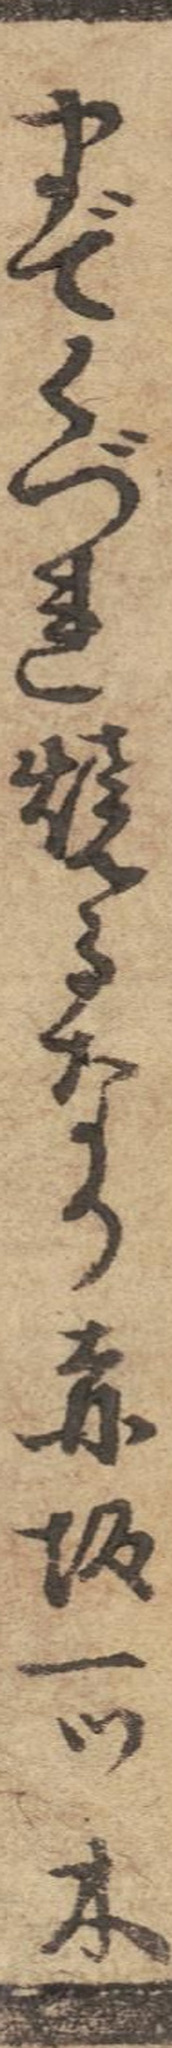までくづれ焼るゝなり赤坂一ッ木
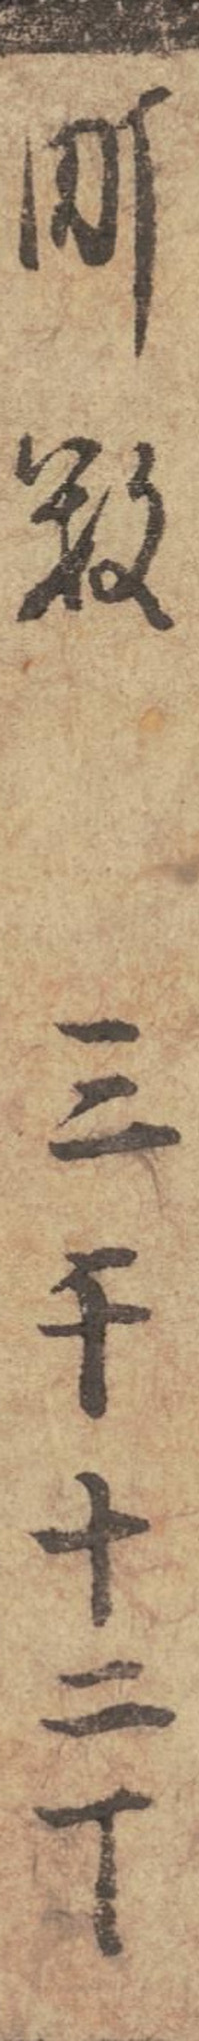町数三千十二丁
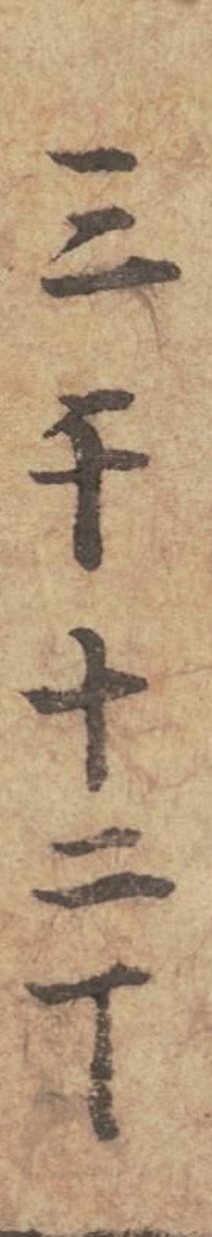町数三千十二丁
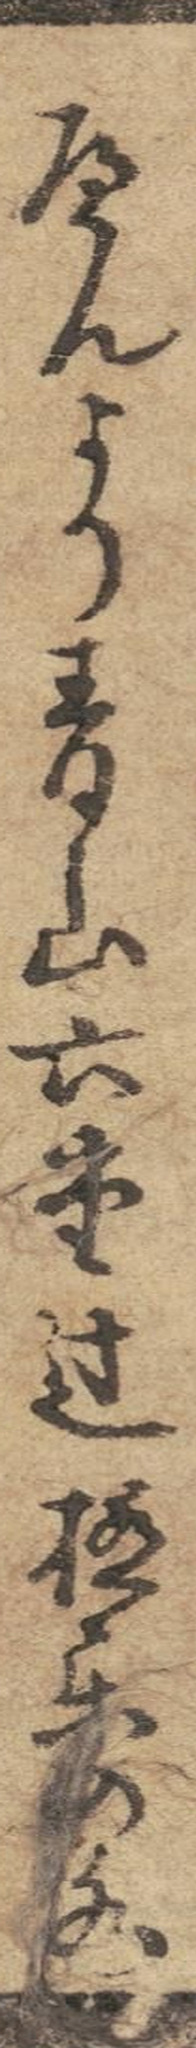へんより青山六堂辻極楽水
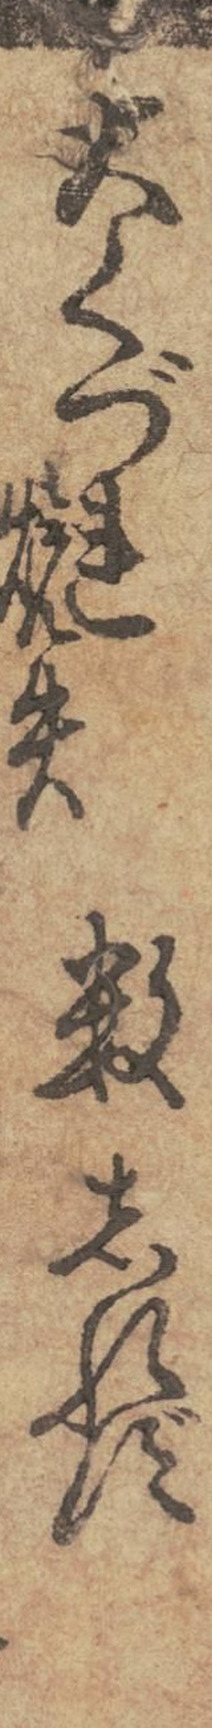火くづれ焼失数しれず
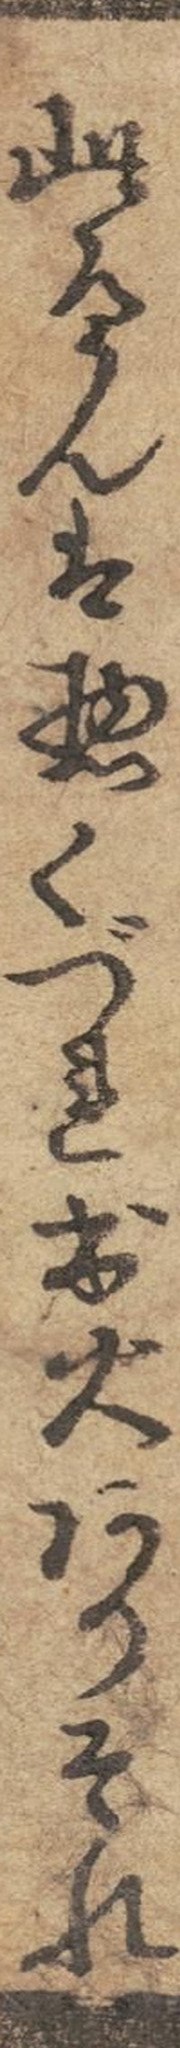山へんは惣くづれ出火ありそれ
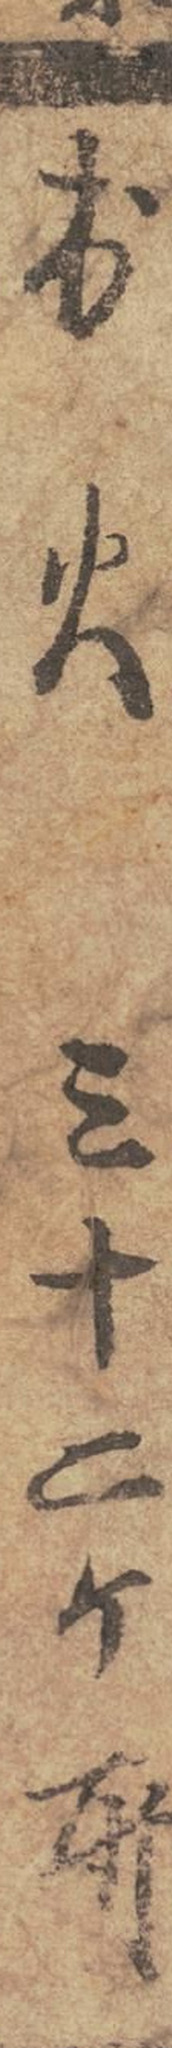出火三十二ヶ所
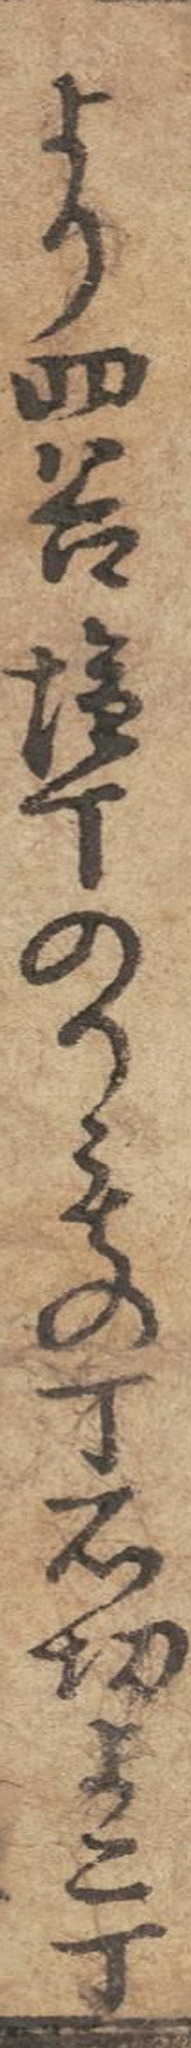より四谷塩町のりもの丁石切よこ丁
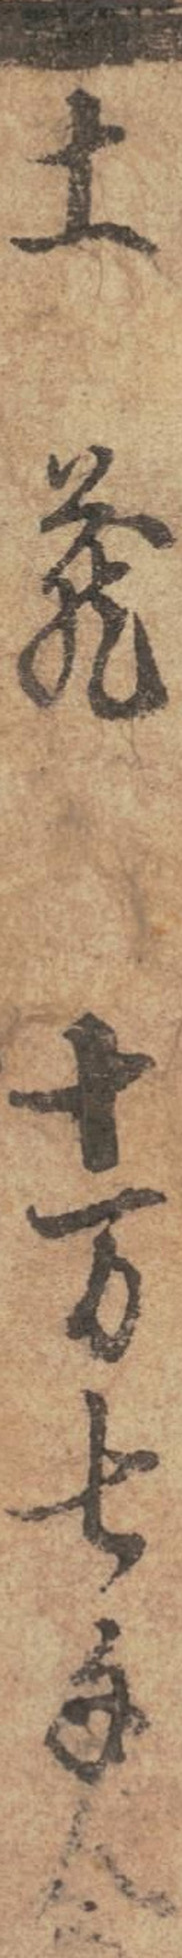土蔵十万七千余
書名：安政二乙卯歳十月二日夜ル四ツ時震始メ末代
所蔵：東京大学地震研究所図書室 Earthquake Research Institute Library, The University of Tokyo, JAPAN
